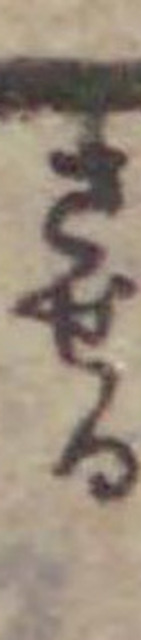させる
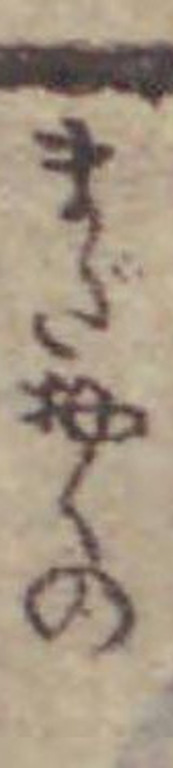やくおくの
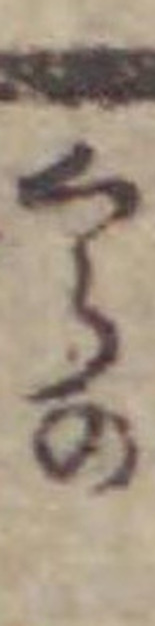くらの
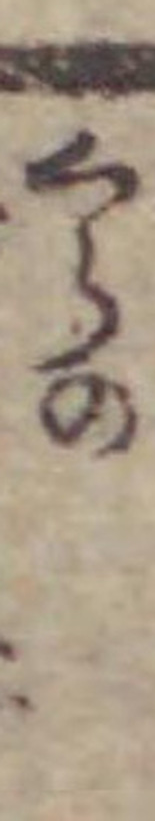くらの
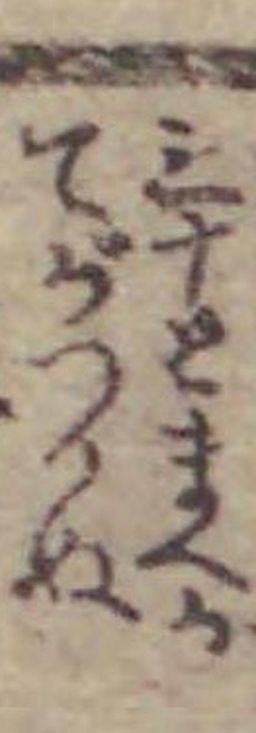てがつかぬ
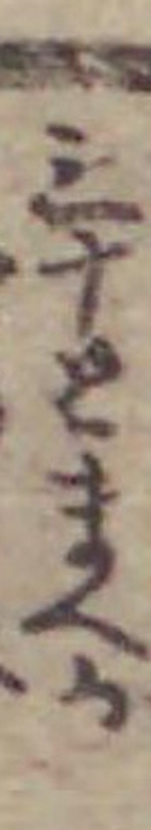三十どまへか
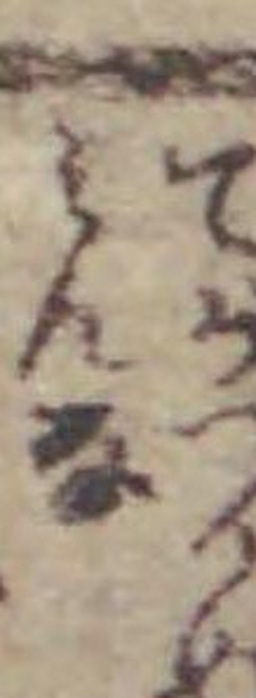みんな
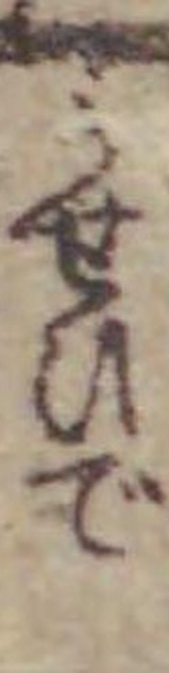かせひで

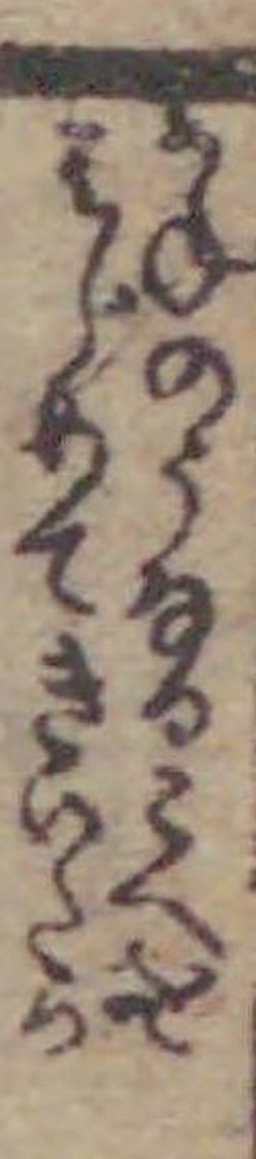はじめてきいたか
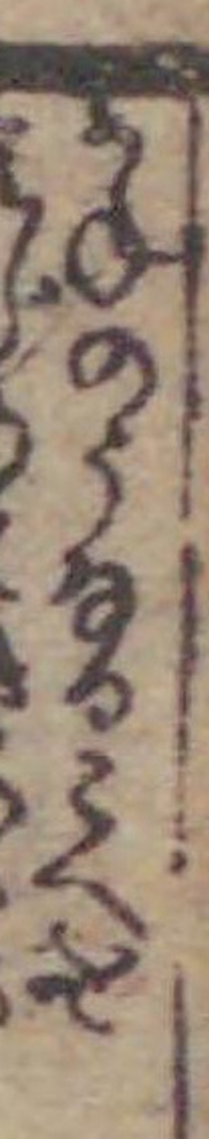かねのうなるこへを
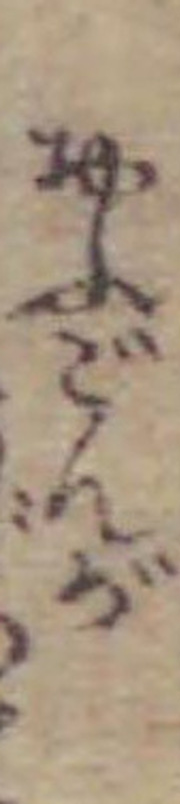おふごんが
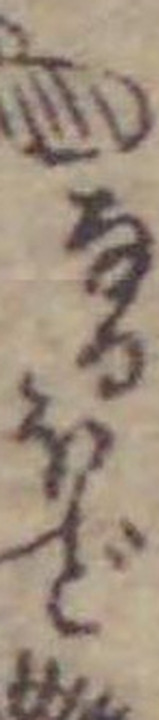なるほど
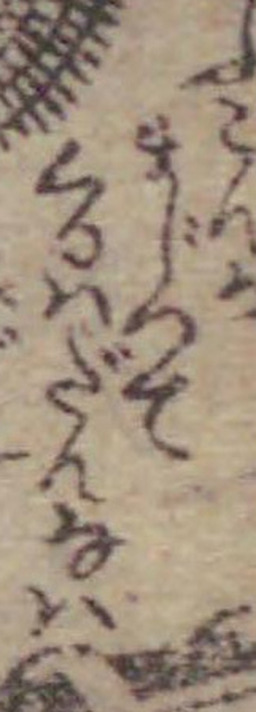くるはだんなは
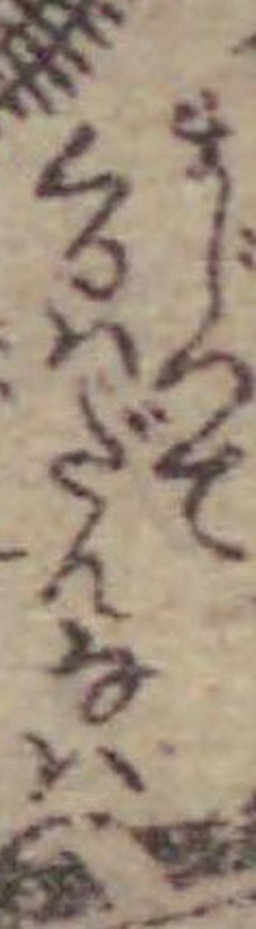くるはだんなは
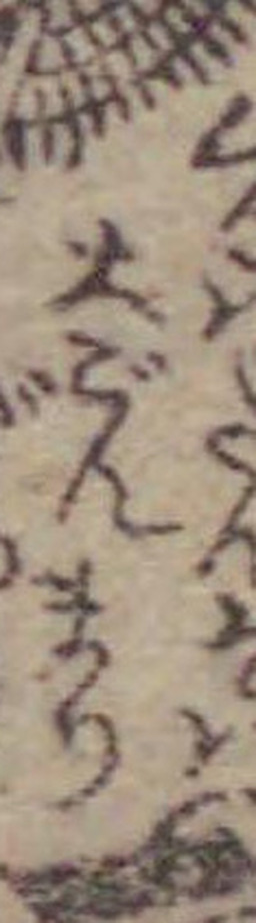大ごんまり
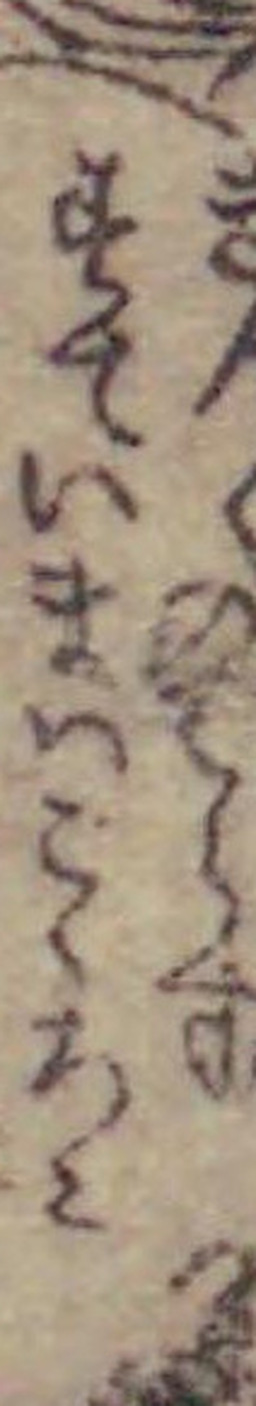すていまはこゝろに
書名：莫切自根金生木 : 3巻
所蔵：国立国会図書館 National Diet Library, JAPAN
